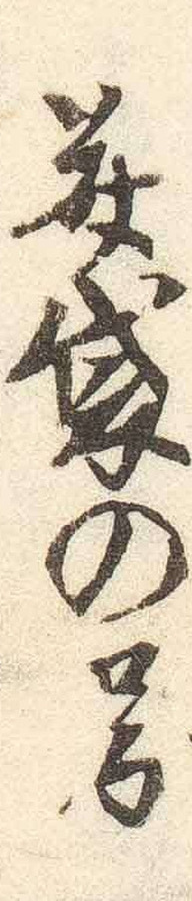美袋の図

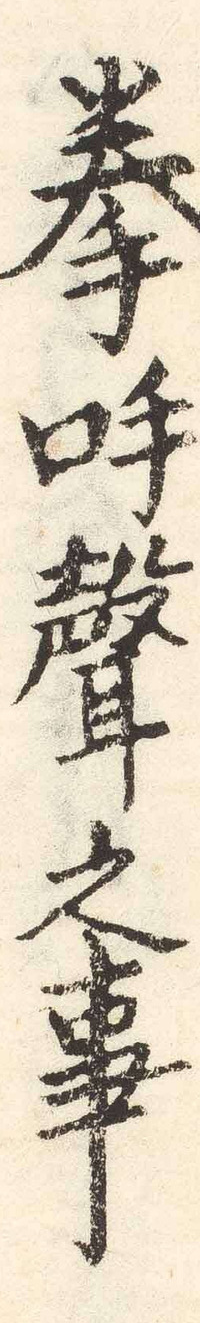拳呼声之事
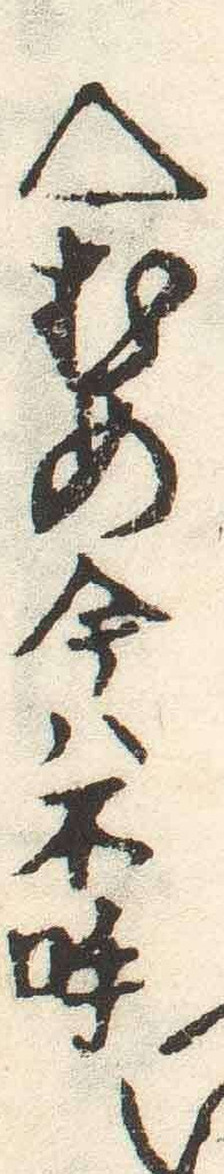△むめ今は不呼
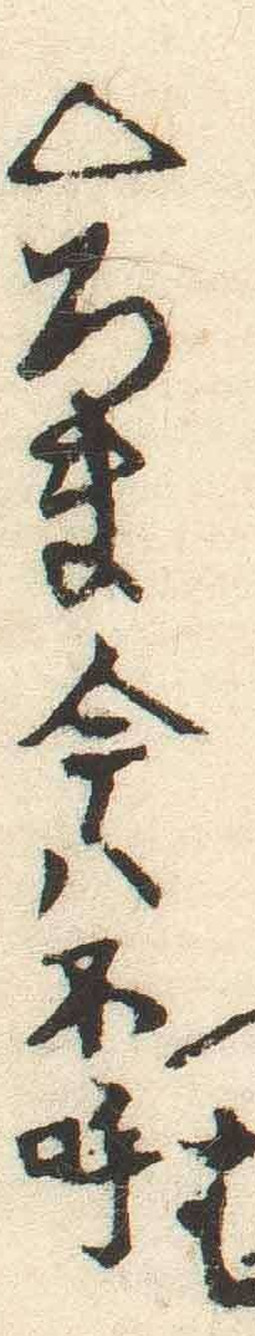△ろま今は不呼

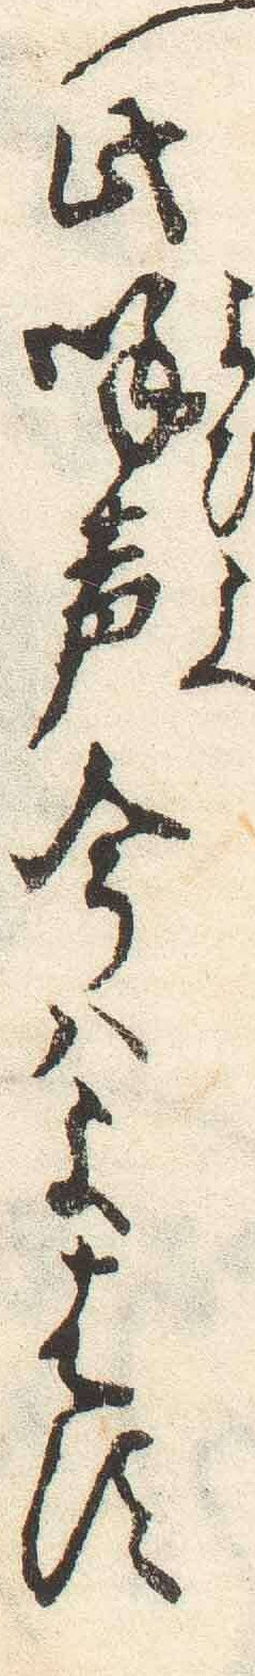此呼声今はよはす
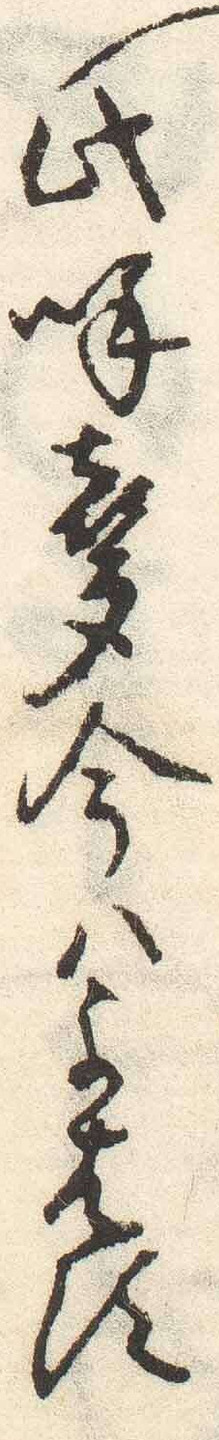此呼声今はよはす
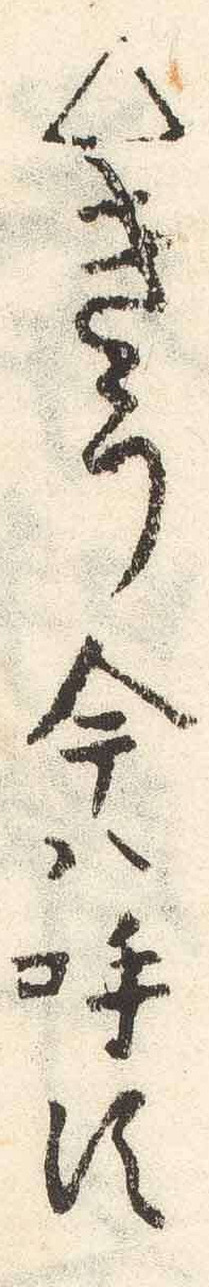△きう今は呼す
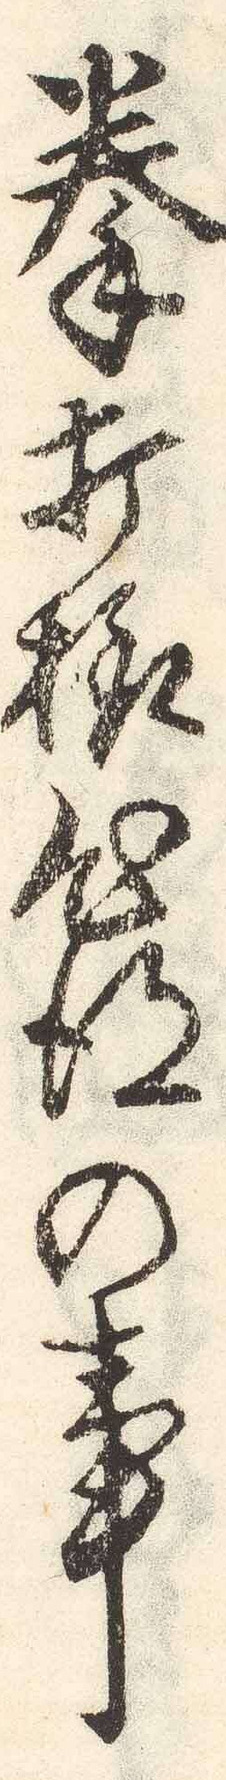拳打様心得の事
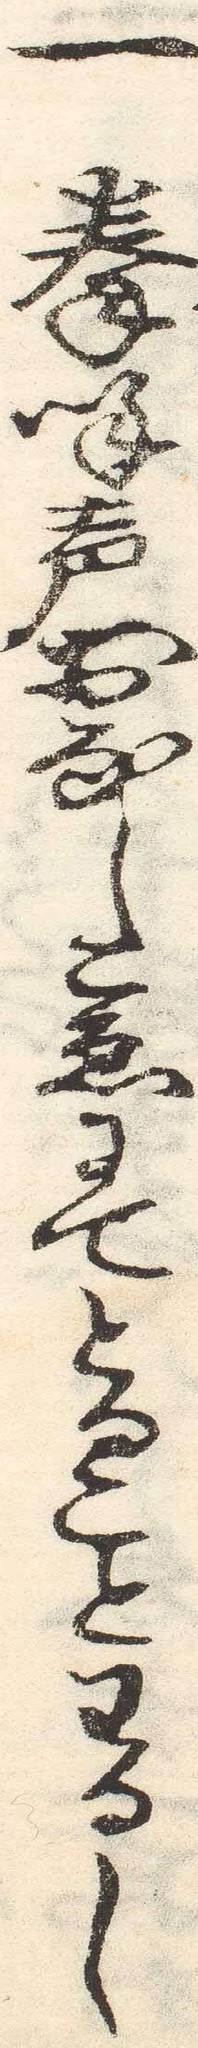一拳呼声おなしこゑにてとることわるし
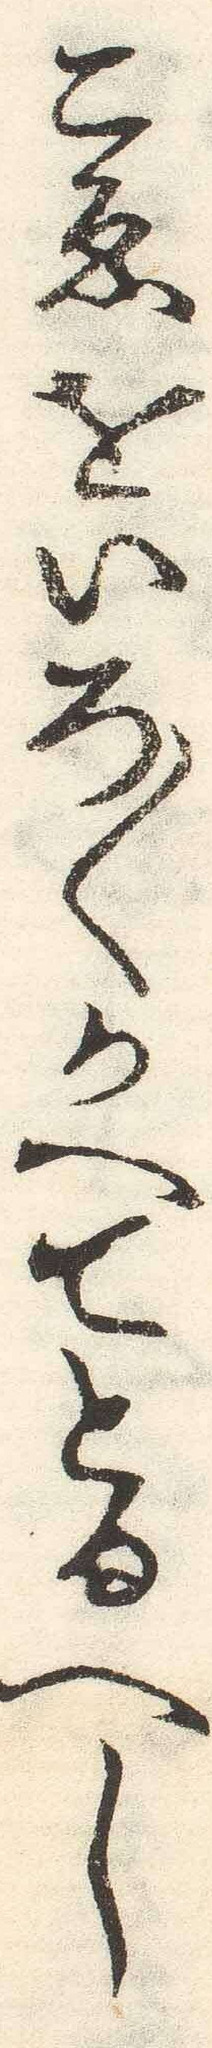こゑをいろ〳〵とかへてとるへし
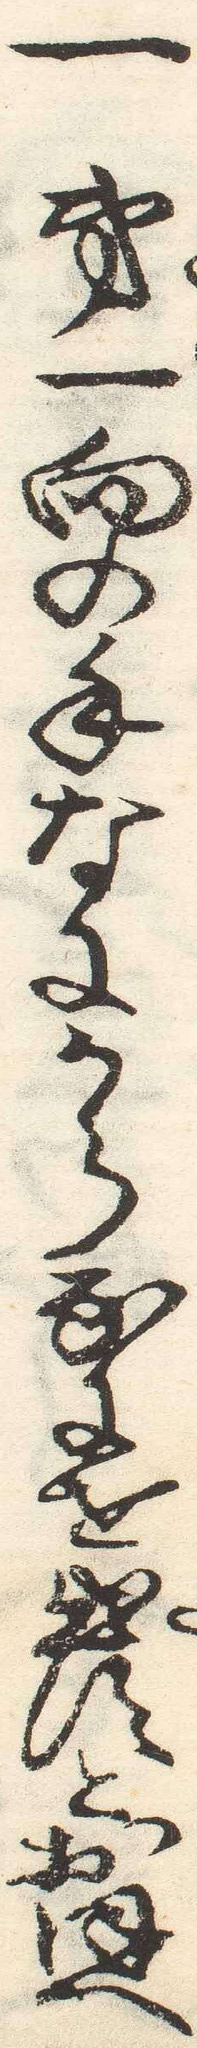一第一向の手なにからなにを出すとおほへ
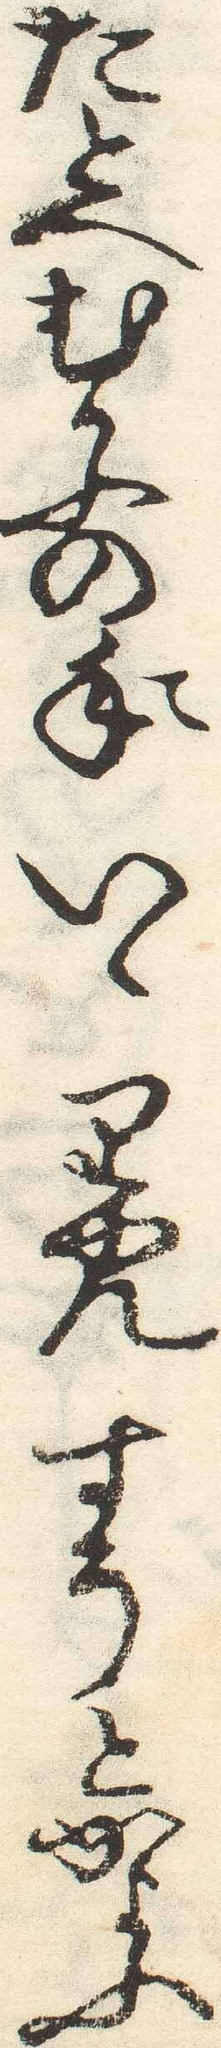たとへむかふの手いゝりやんすうとかよふ
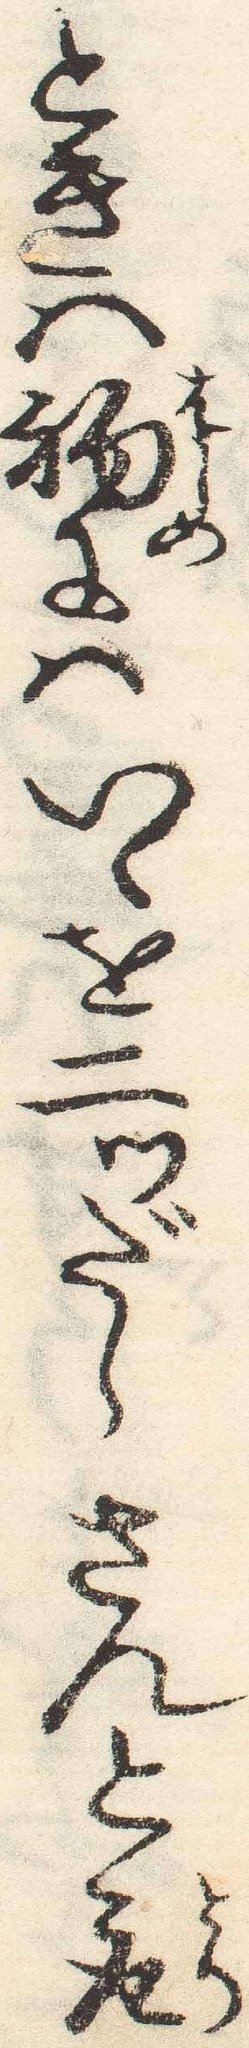ときは初にはいゝを二ッだしさんと取
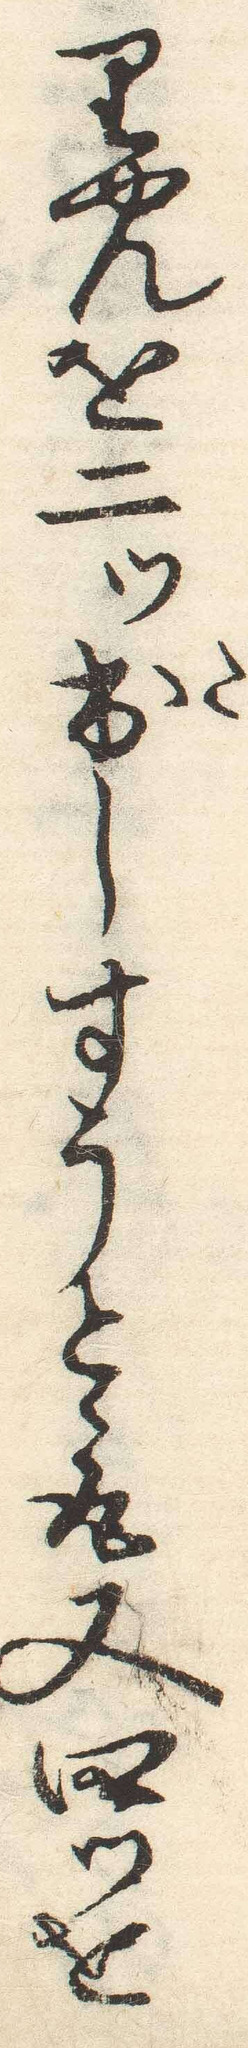りやんを二ッ出しすうと取又四ッを

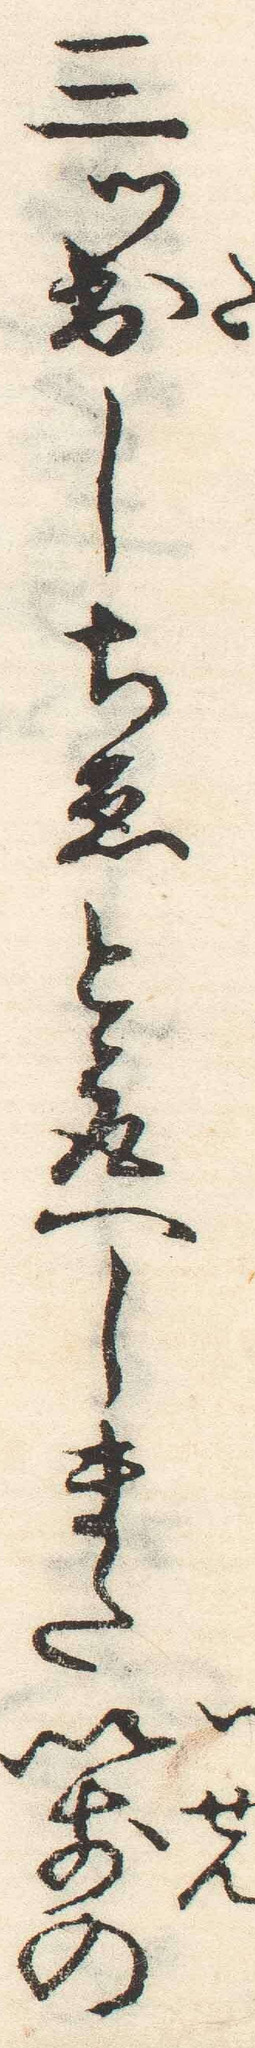三ッ出しちゑと取へしまたいぜ以前の
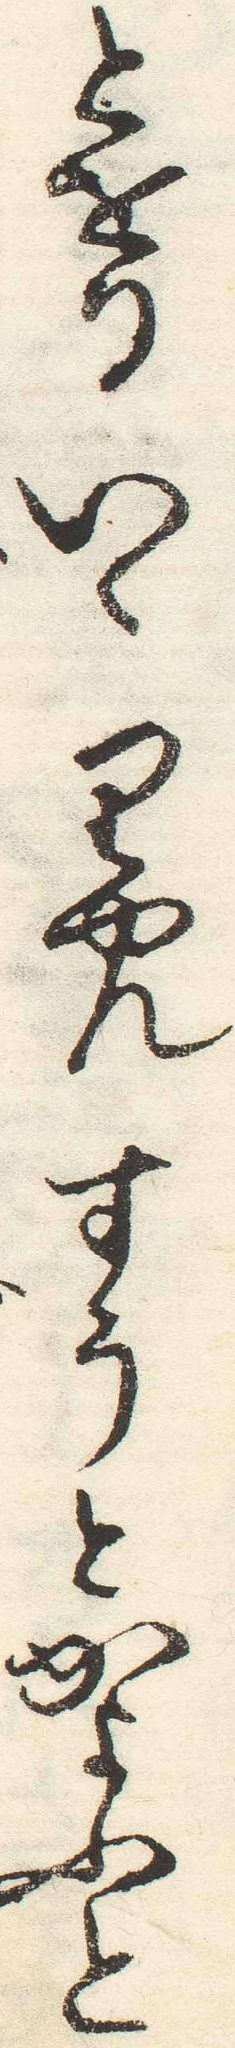とをりいゝりやんすうとかよふと
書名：拳独稽古
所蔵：東京学芸大学附属図書館 国文学研究資料館
